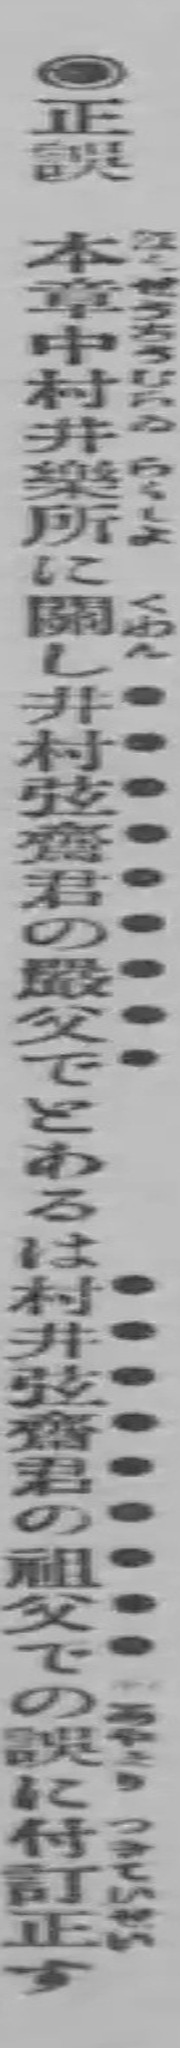◉正誤本章中村井楽所に関し井村弦斉君の厳父でとあるは村井弦斉君の祖父での誤に付訂正す
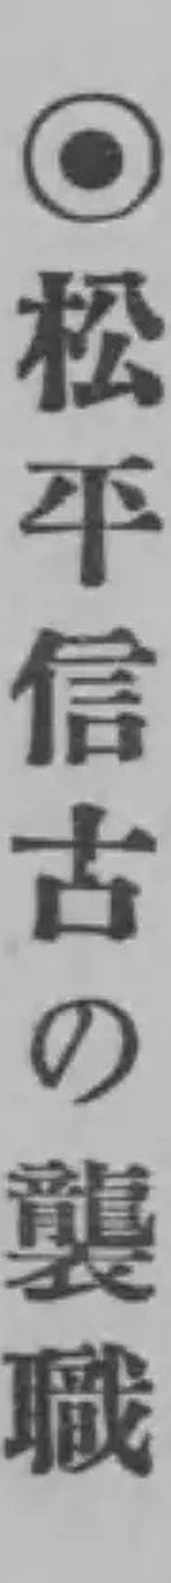◉松平信古の襲職
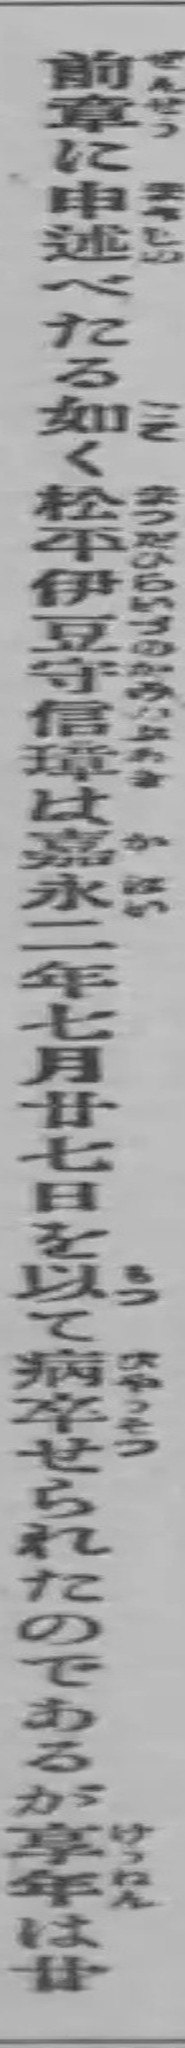前章に申述べたる如く松平伊豆守信璋は嘉永二年七月廿七日を以て病卒せられたのであるが享年は廿
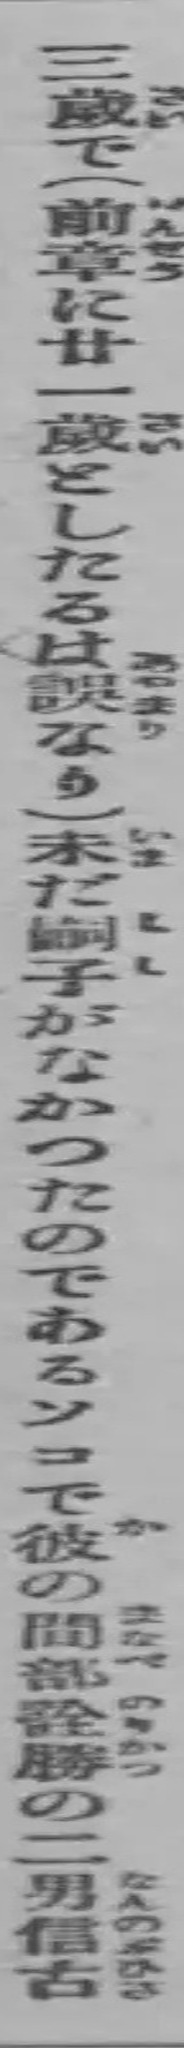三歳で(前章に廿一歳としたるは誤なり)未だ嗣子がなかつたのであるソコで彼の間部詮勝の二男信古

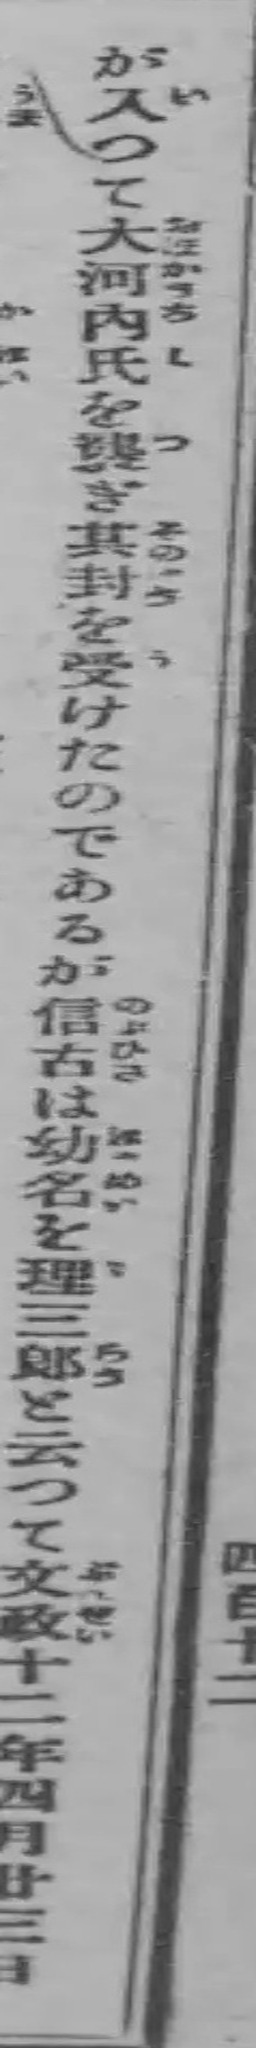が入つて大河内氏を襲ぎ其封を受けたのであるが信古は幼名を理三郎と云つて文政十二年四月廿三日
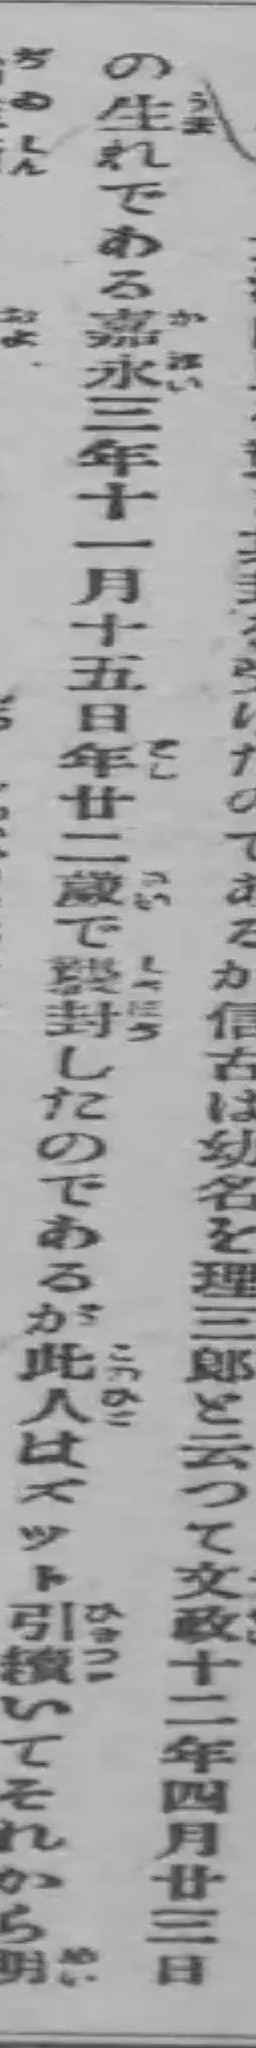の生れである嘉永三年十一月十五日年廿二歳で襲封したのであるが此人はズツト引続いてそれから明
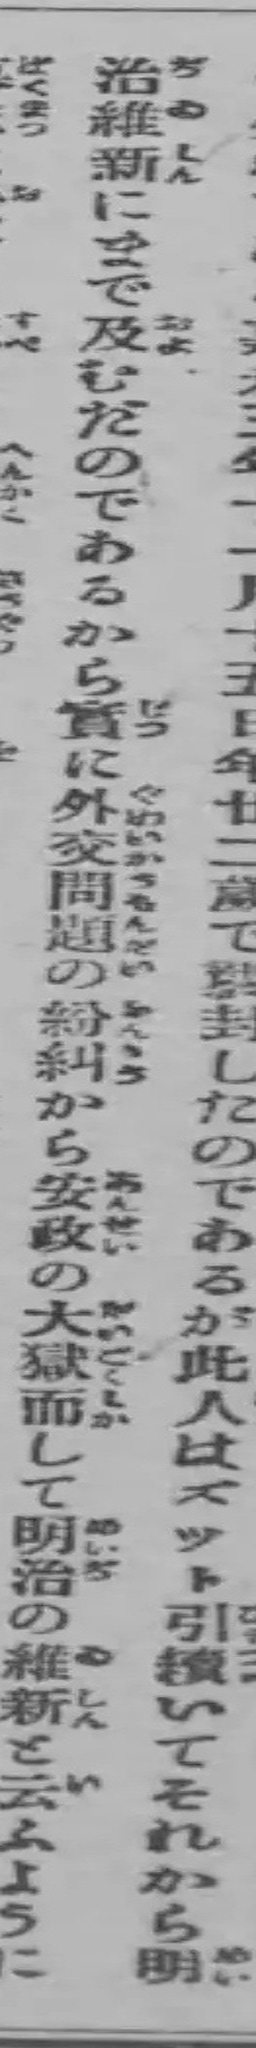治維新にまで及むだのであるから実に外交問題の紛糾から安政の大獄而して明治の維新と云ふように
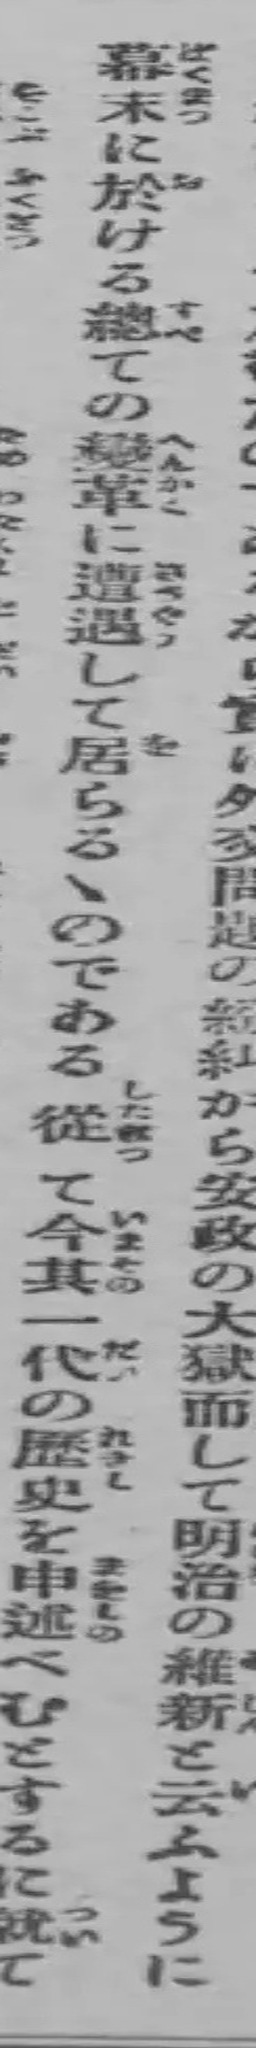幕末に於ける総ての変革に遭遇して居らるゝのである従て今其一代の歴史を申述べむとするに就て
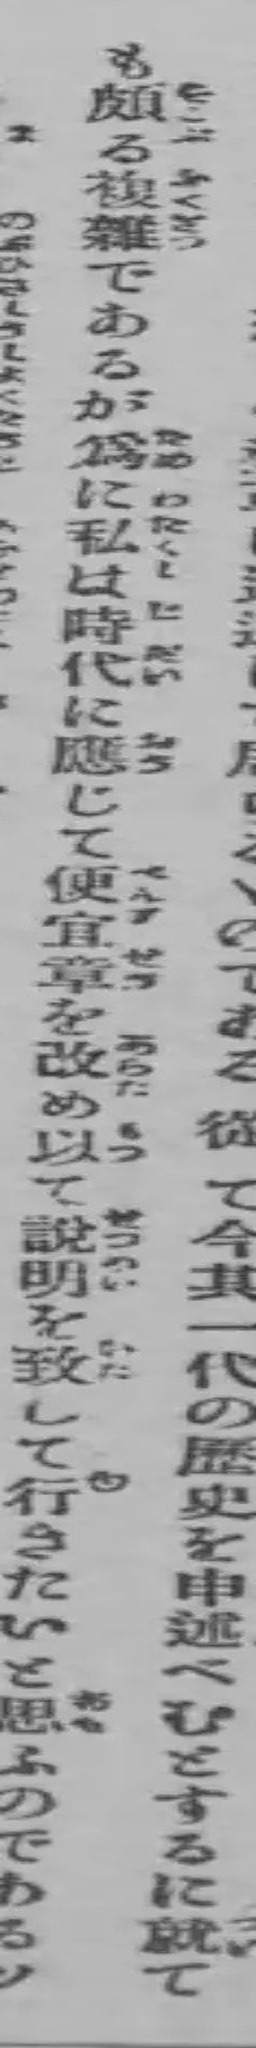も頗る複雑であるが為に私は時代に応じて便宜章を改め以て説明を致して行きたいと思ふのであるソ
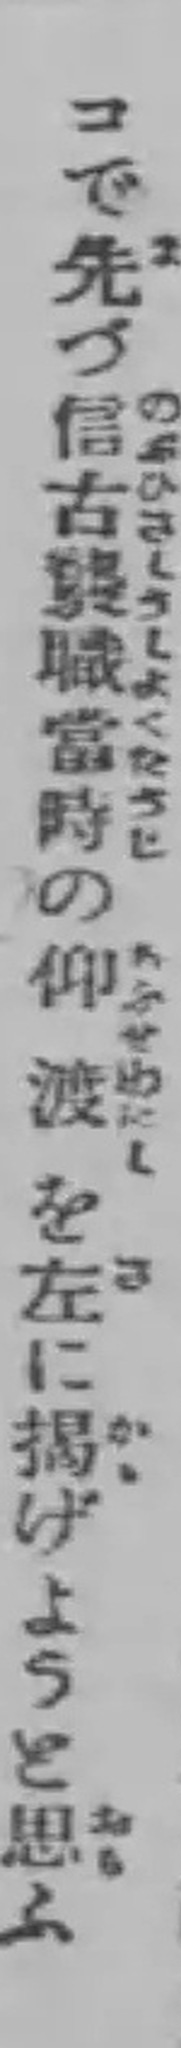コで先づ信古襲職当時の仰渡を左に掲げようと思ふ
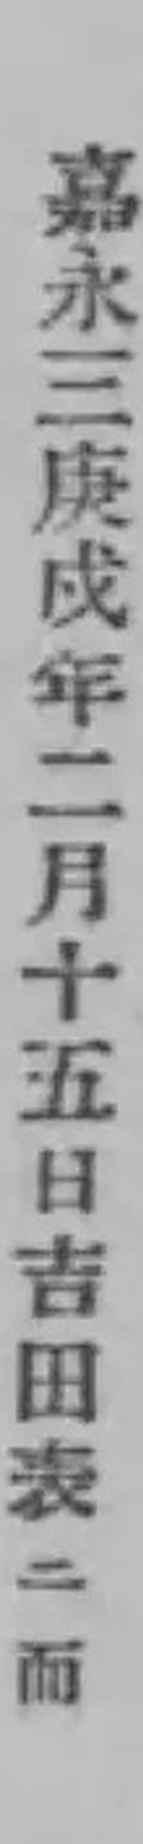嘉永三庚戌年二月十五日吉田表ニ而
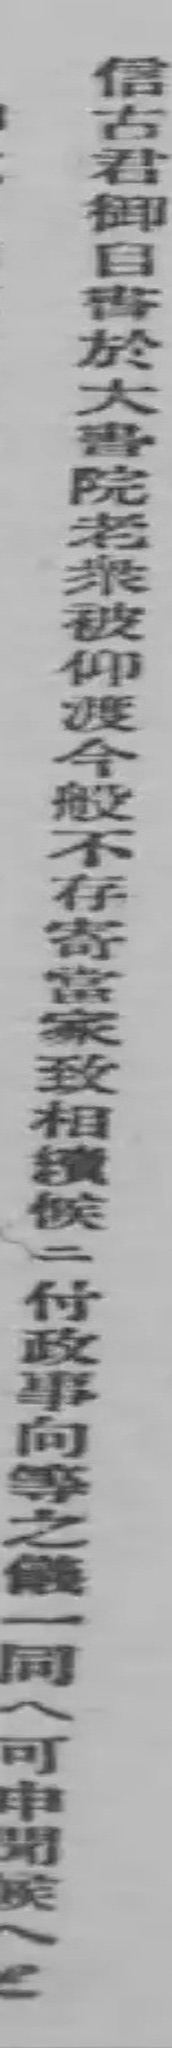信古君御自書於大書院老衆被仰渡今般不存寄当家致相続候ニ付政事向等之儀一同へ可申聞候へと
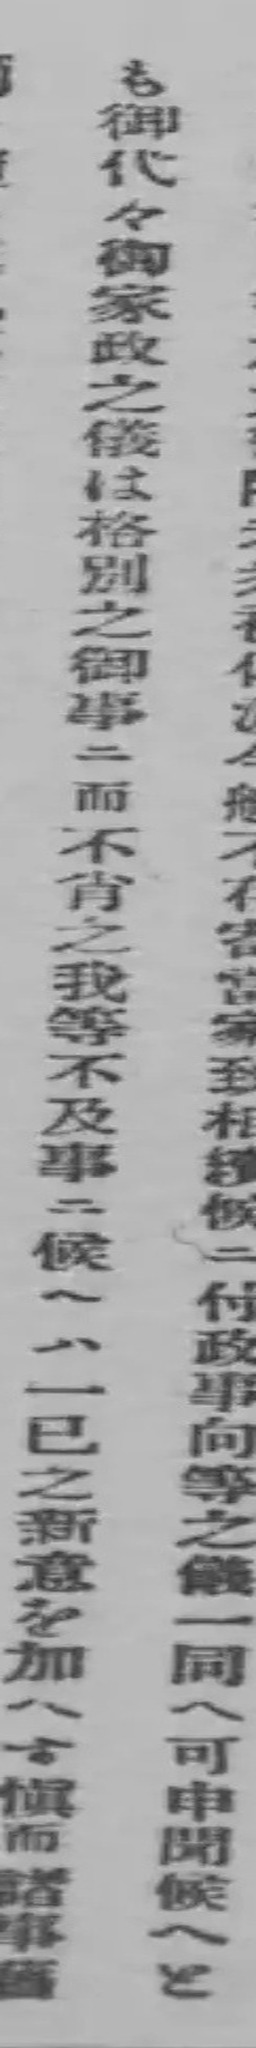も御代々御家政之儀は格別之御事ニ而不肖之我等不及事ニ候へハ一巳之新意を加へす慎而諸事旧
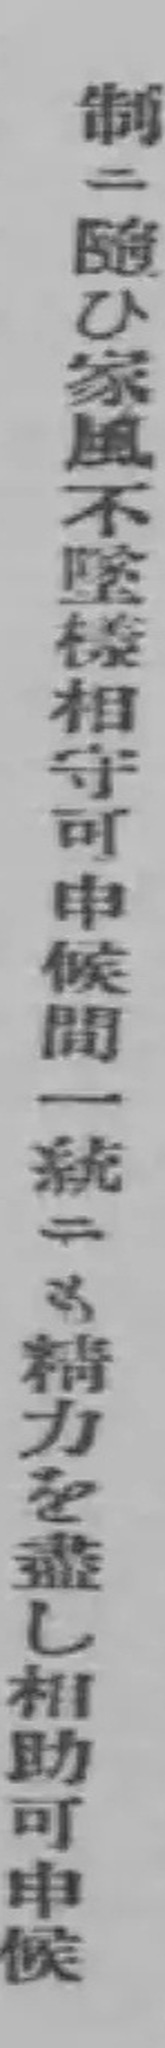制ニ随ひ家風不墜様相守可申候間一統ニも精力を尽し相助可申候
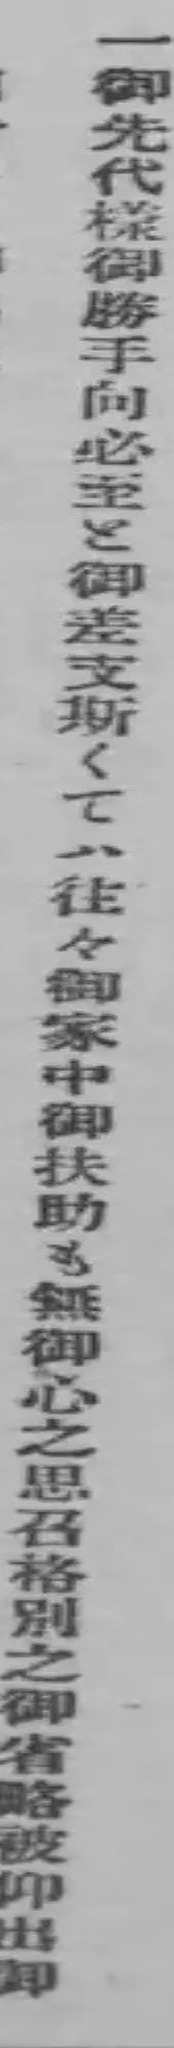一御先代様御勝手向必至と御差支斯くてハ往々御家中御扶助も無御心之思召格別之御省略被仰出御
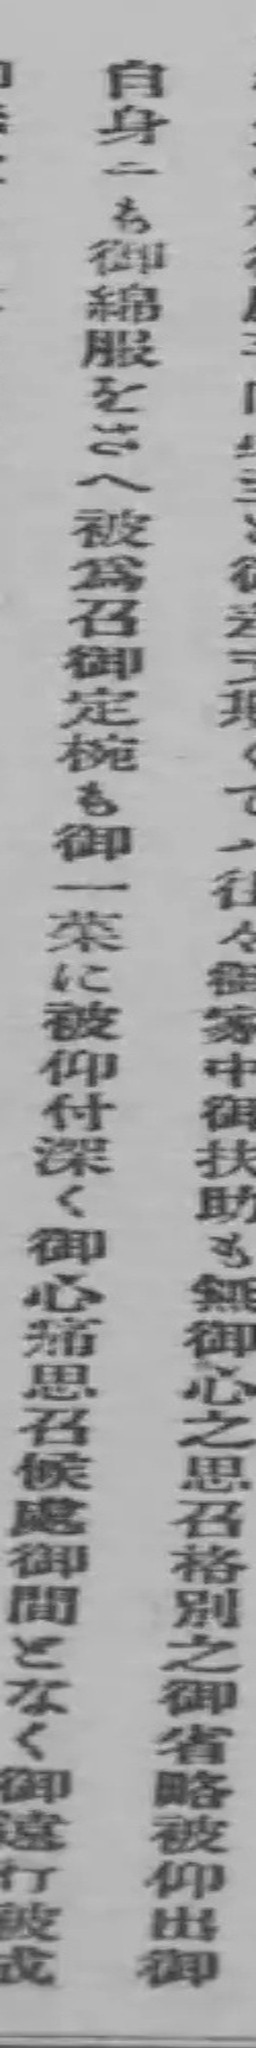自身ニも御綿服をさへ被為召御定椀も御一菜に被仰付深く御心痛思召候処御間となく御遠行被成
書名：豊橋市史談
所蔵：国立国会図書館 National Diet Library, JAPAN
